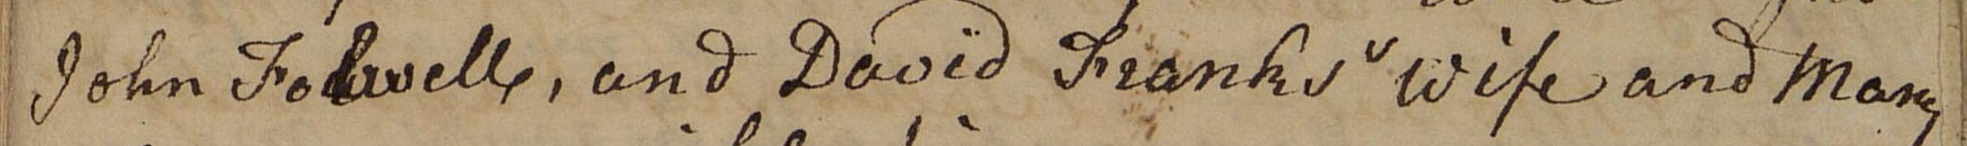John Folwell, and David Franks^s wife and Many
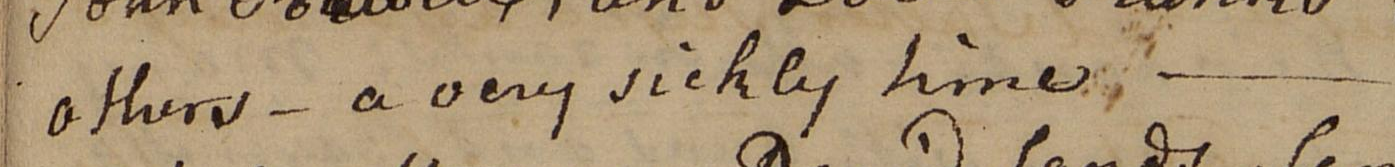others- a very sickly time-
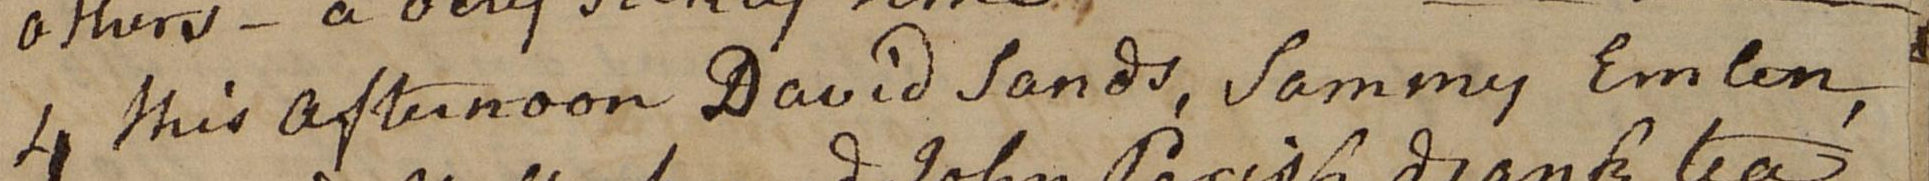4 this afternoon David Sands, Sammy Emlen,
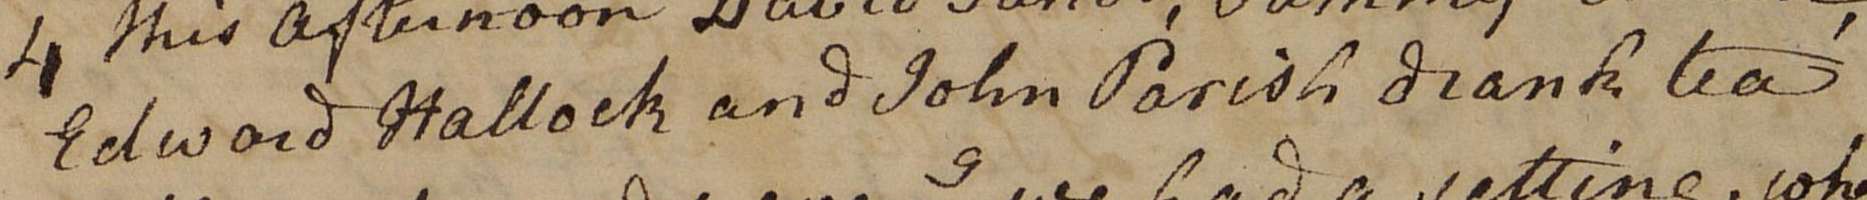Edward Hallock and John Parish drank tea
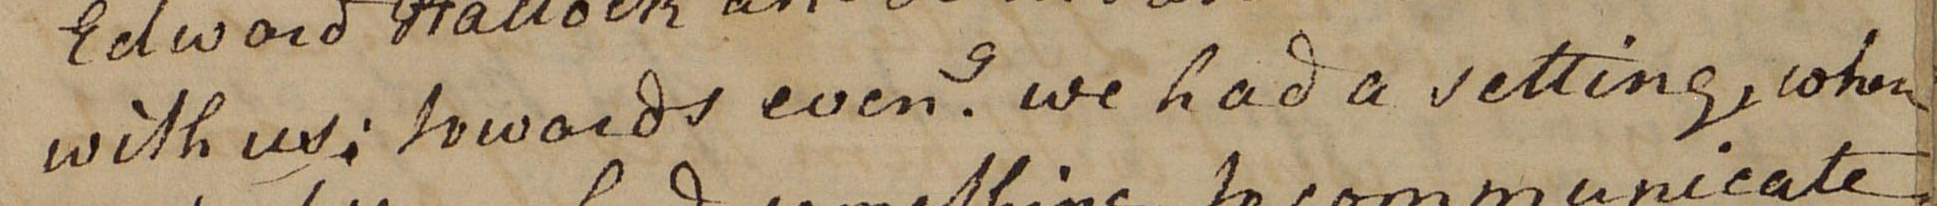with us; towards even^g. we had a setting, when
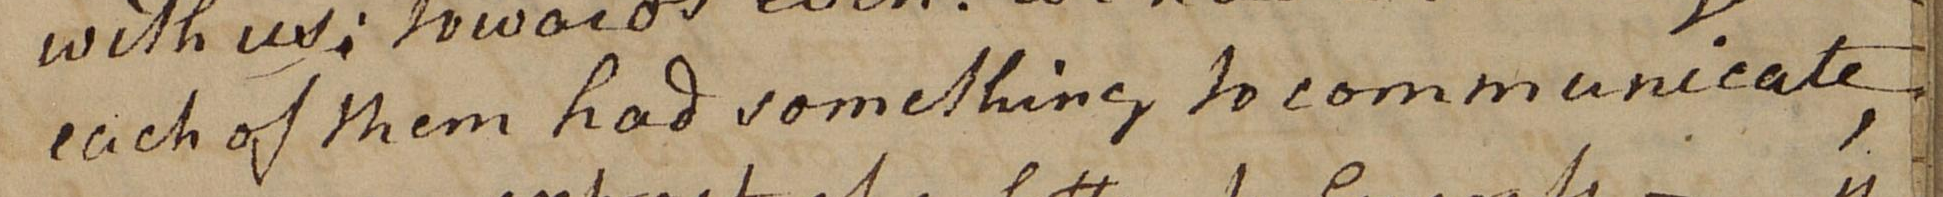each of them had something to communicate
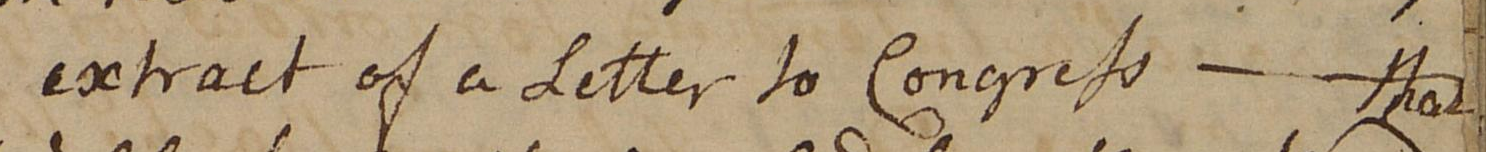extract of a Letter to Congress- that
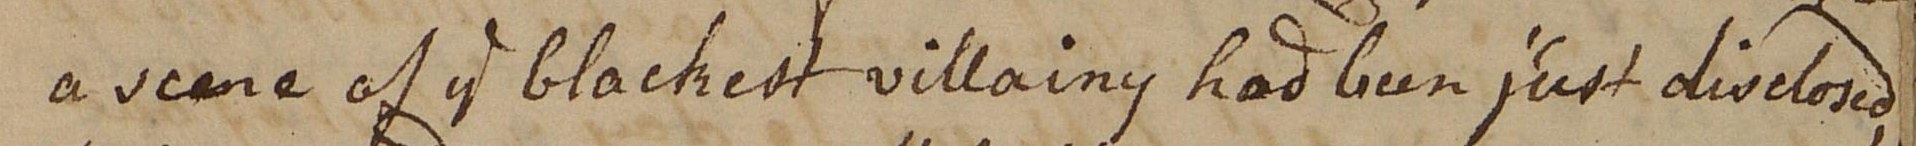a scare of y^e blackest villainy had been just disclosed,
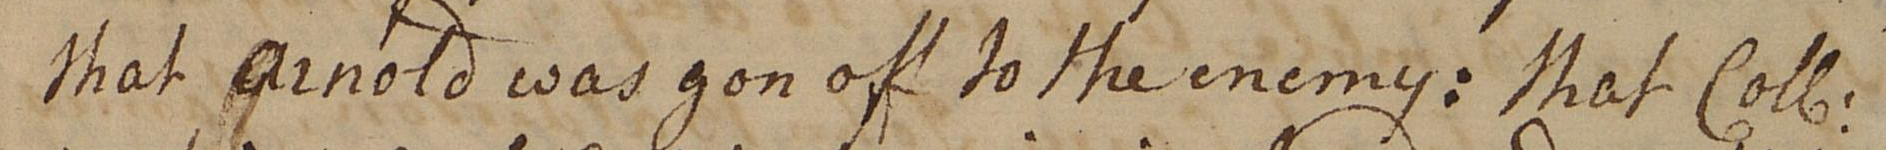that Arnold was gon of to the enemy; that Coll:
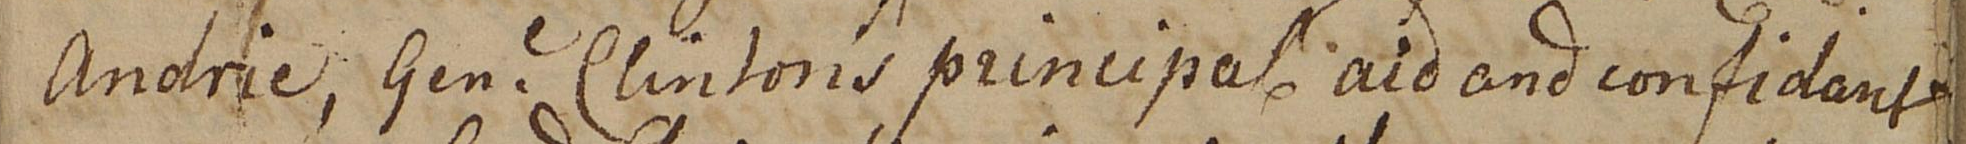Andrie, Gen^l. Clintons principal aid and confidant
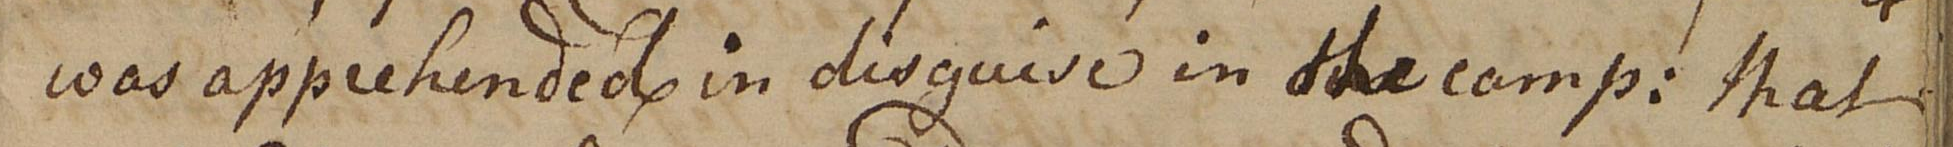was apprehended in disguise in the camp: that
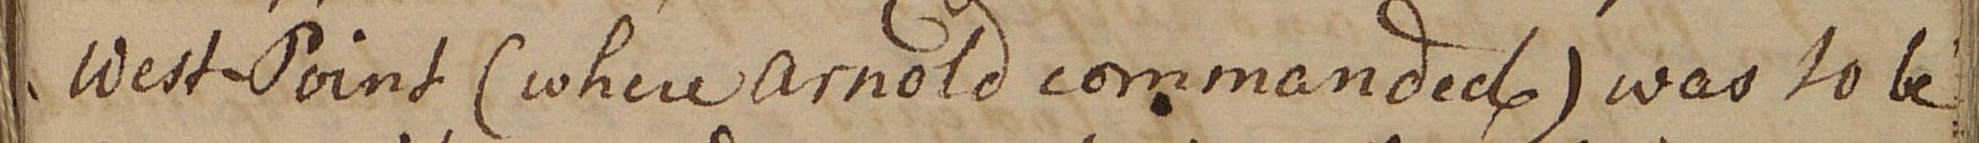West Point (where Arnold commanded) was to be
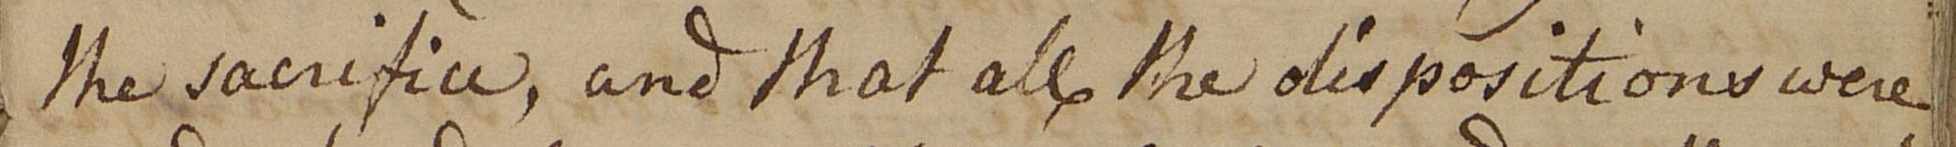the sacrifice, and that all the dispositions were
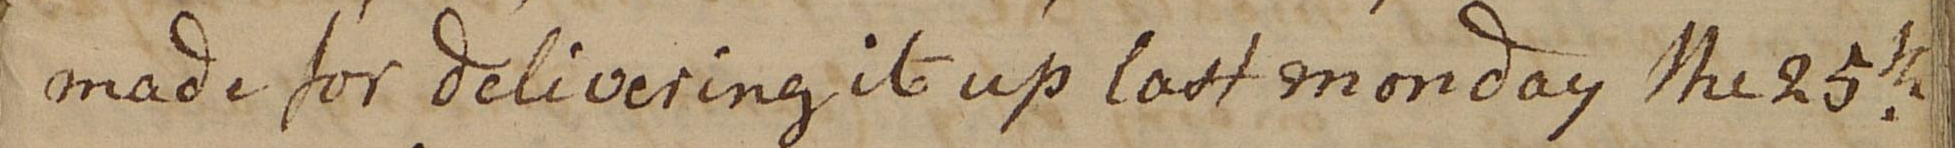made for delivering it up last monday the 25^th
